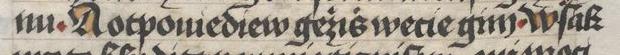nu.A otpouiediew geżiṡ wecie gím.Wẛak
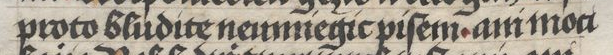proto bludíte nevmíegíc píſem.ani moci
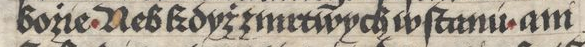bożíe.Neb kdyż zmrtwych wſtanú.ani
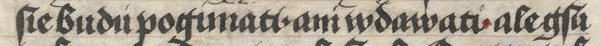ſie budú pogimati.ani wdawati.ale gſu
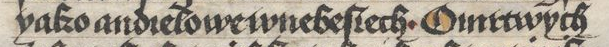yako andielowe nebeſiech.Omrtwych
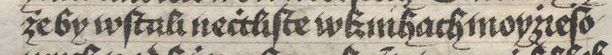że by wſtali neċtliſte wknihach moyżíeẛo¬
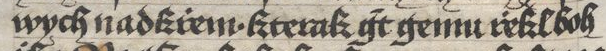wych nadkṙem.kterak ḡt gemu ṙekl boh
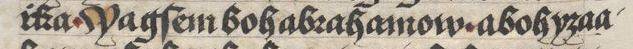ṙka.Ya gſem boh abrahamow.a boh yzaa¬
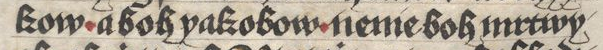kow.a boh yakobow.neníe boh mrtwy¬
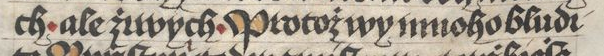ch.ale žiwych.Protoż wy mnoho bludi¬
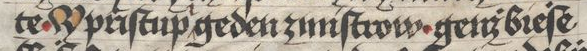te.Y pṙiſtup gedeti zmiſtrow.genż bíeẛe
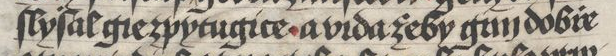ſlyẛal gie zyytugíce.a vida żeby gim dobṙe
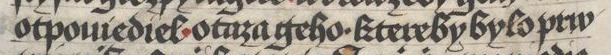otpouiediel.otaza geho.ktereby bylo prw¬
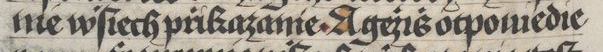níe wẛiech pṙikazaníe.A geżiṡ otpouiedie
